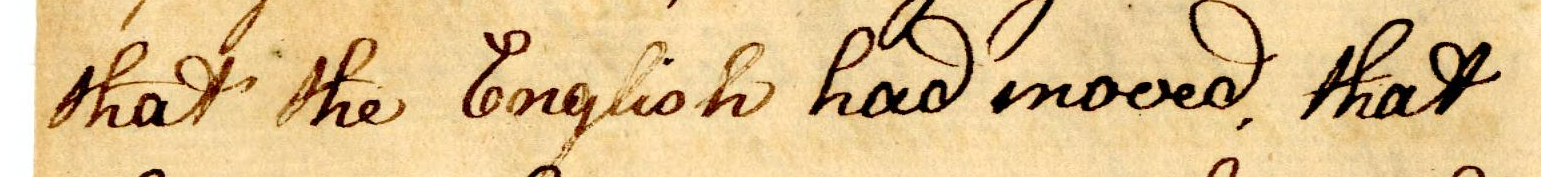that the English had moved, that
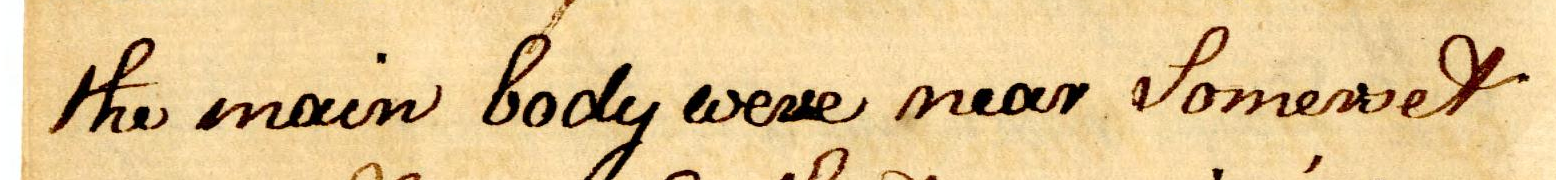the main body were near Somerset
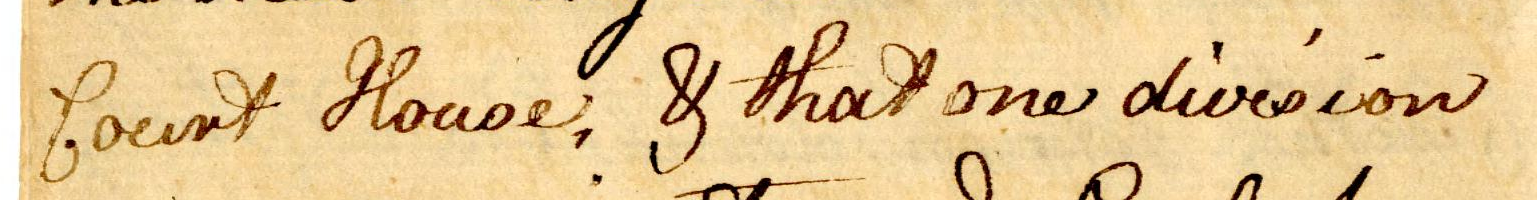Court House, & that one division
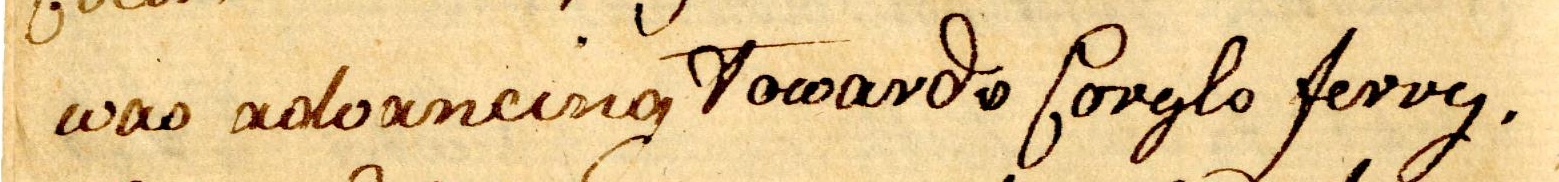was advancing towards Coryls ferry.
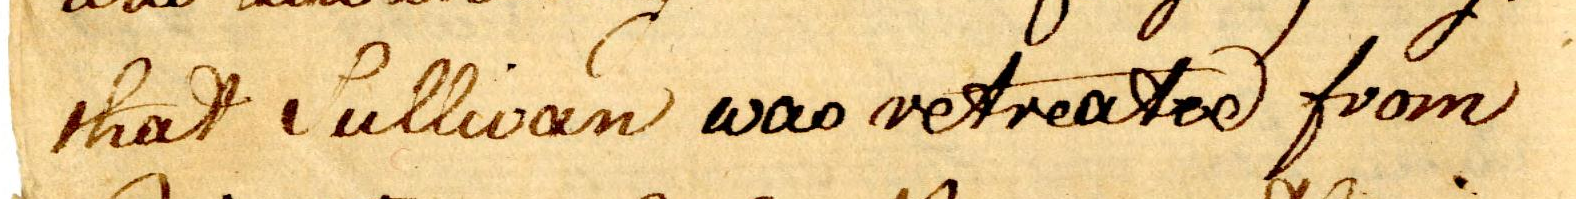that Sullivan was retreated from
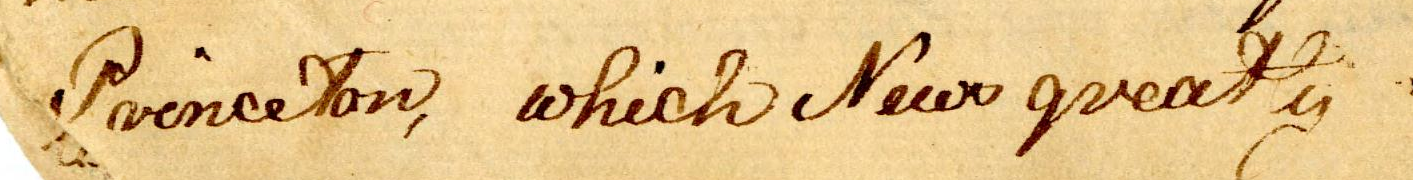Princeton, which News greatly
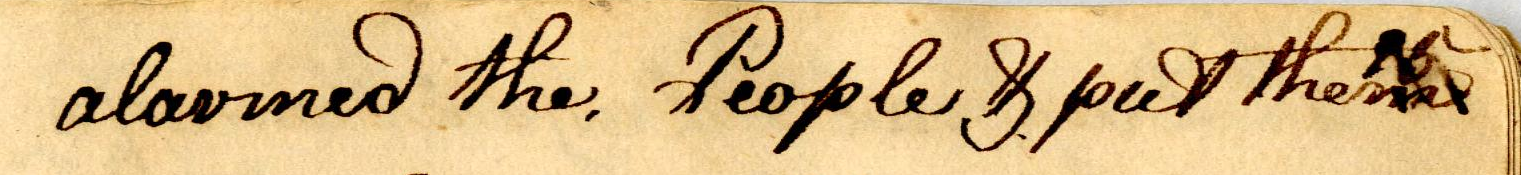alarmed the, People & put them
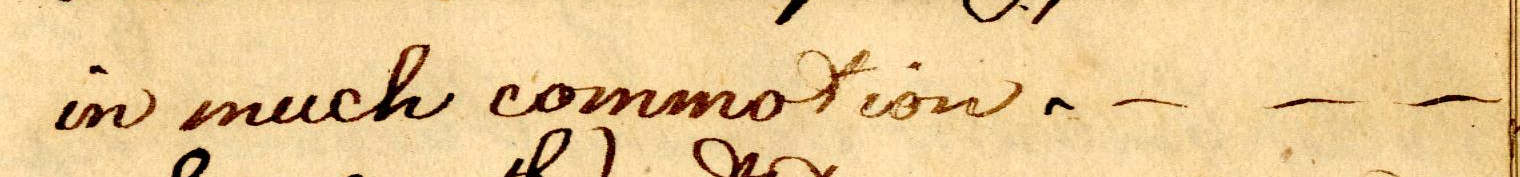in much commotion.---
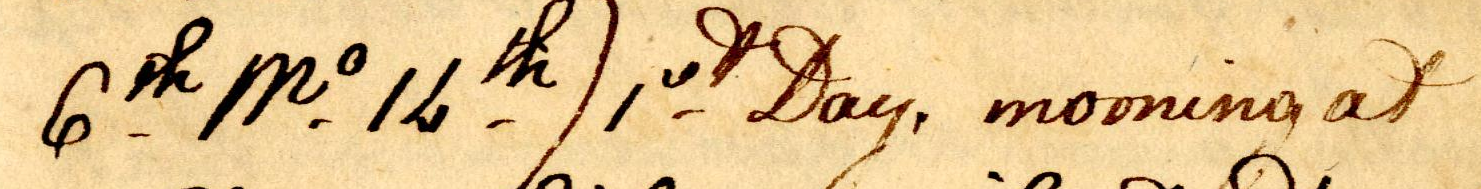6^th M^o 14^th ) 1^st Day. morning at
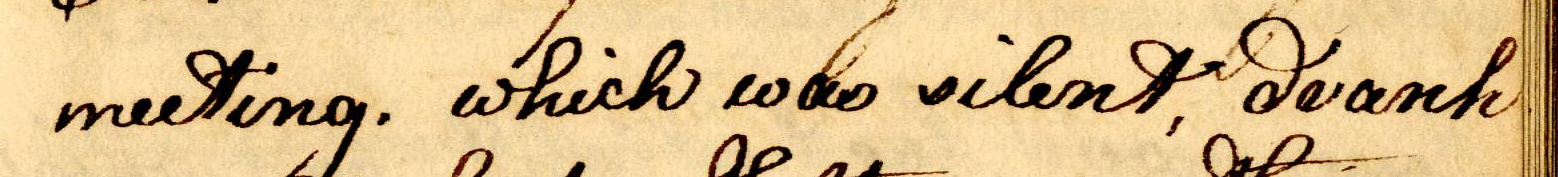meeting. which was silent, drank
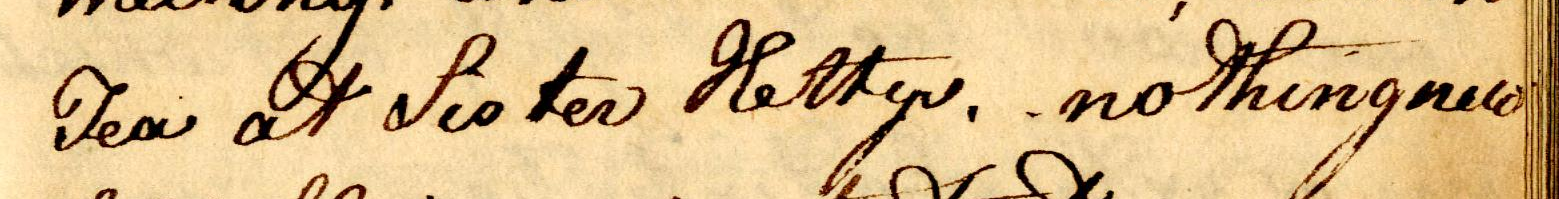Tea at Sister Hettys. nothing new
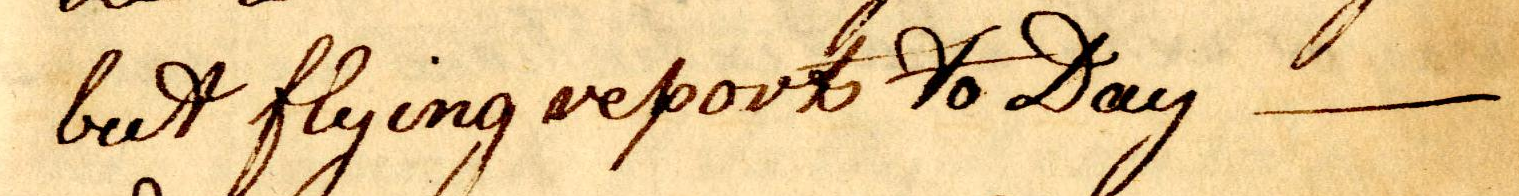but flying reports to Day-
